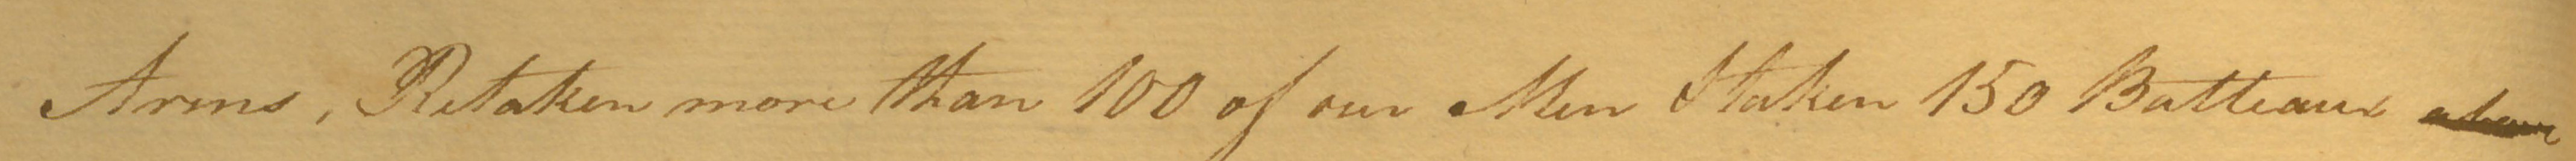Arms. Retaken more than 100 of our Men & taken 150 Batteaux [above]
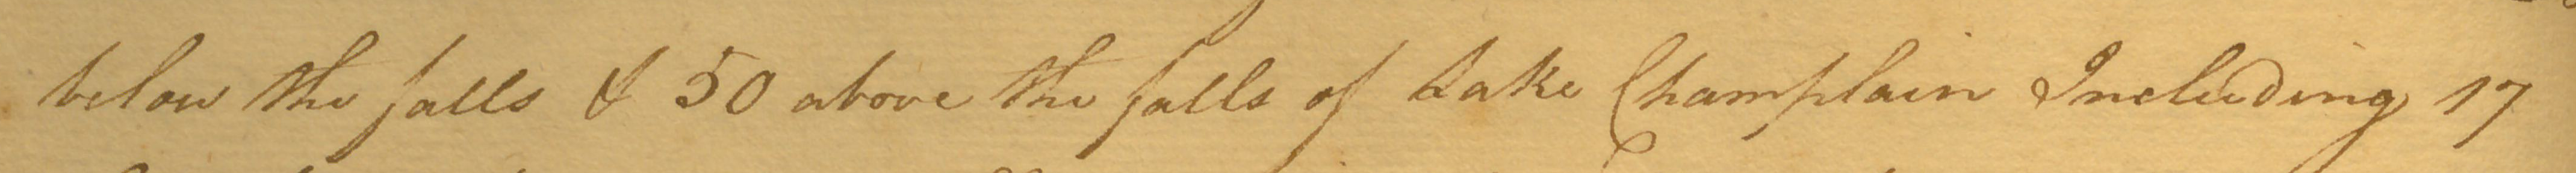below the falls & 50 above the falls of Lake Champlain Including 17
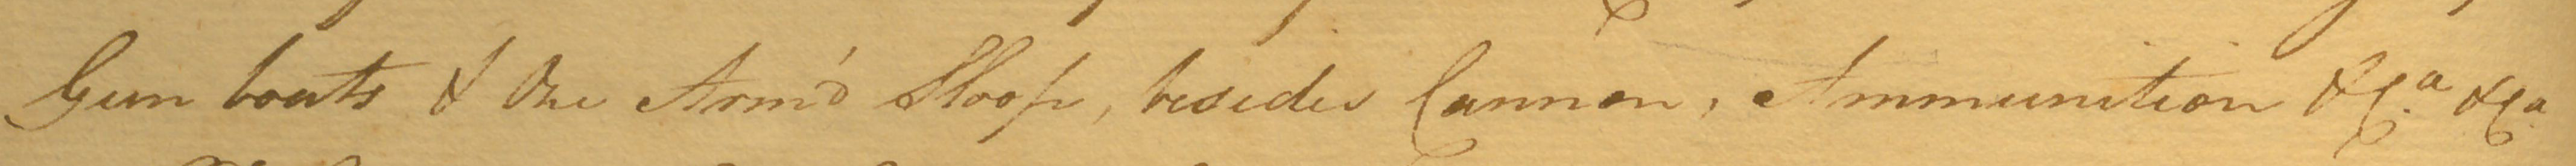Gun boats & one Arm'd Sloop, besides Cannon, Ammunition &c^a. &c&a.
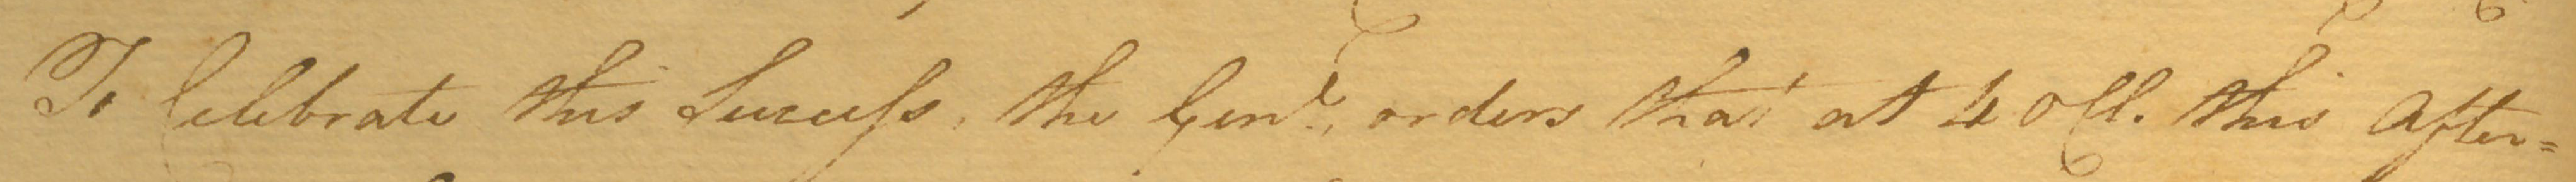To Celebrate this Success, the Gen^l. orders that at 4 oCl. this After-
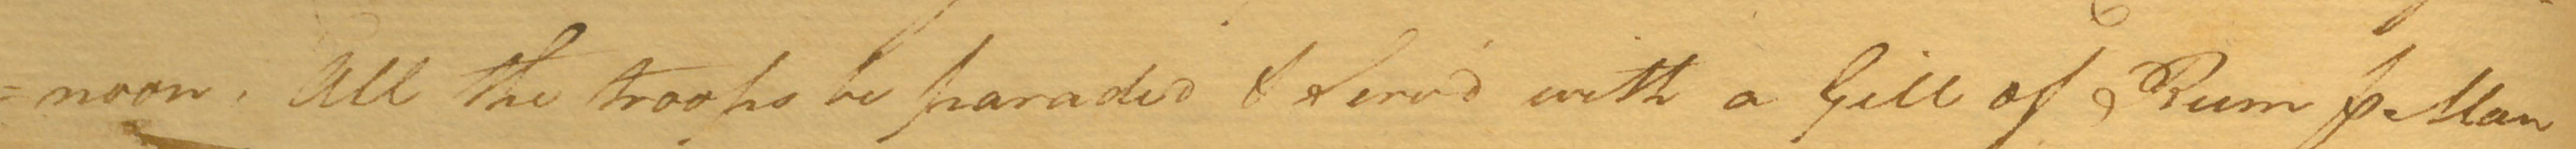-noon, All the troops be paraded & serv'd with a Gill of Rum per Man
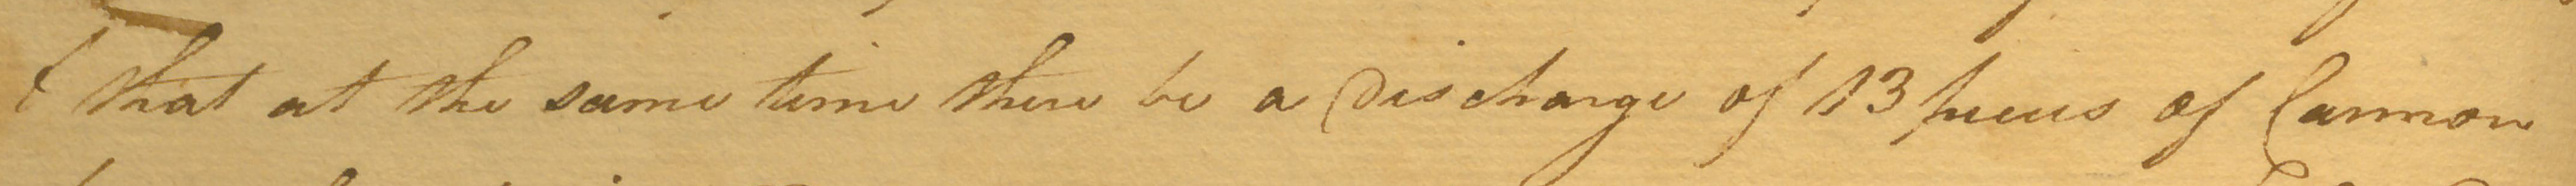& that at the same time there be a discharge of 13 pieces of Cannon
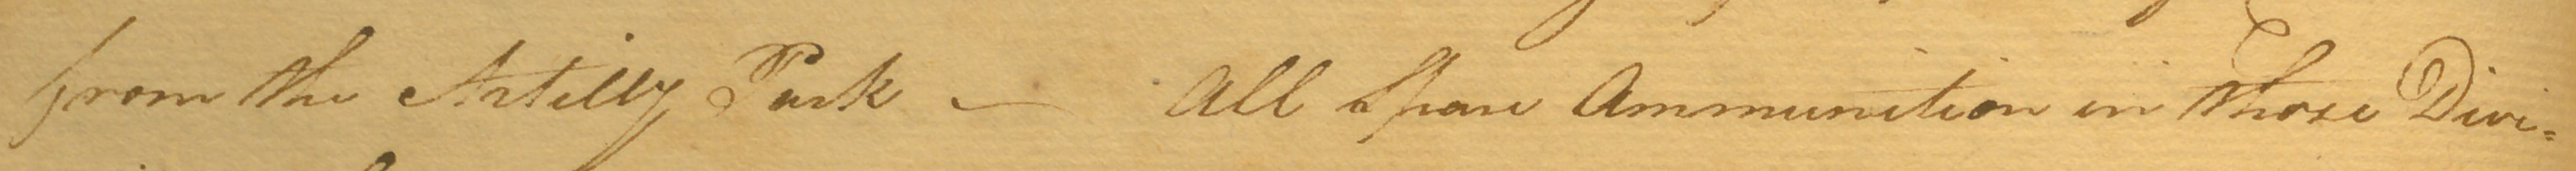from the Artill^y Park- All Spare Ammunition in those Divi-
